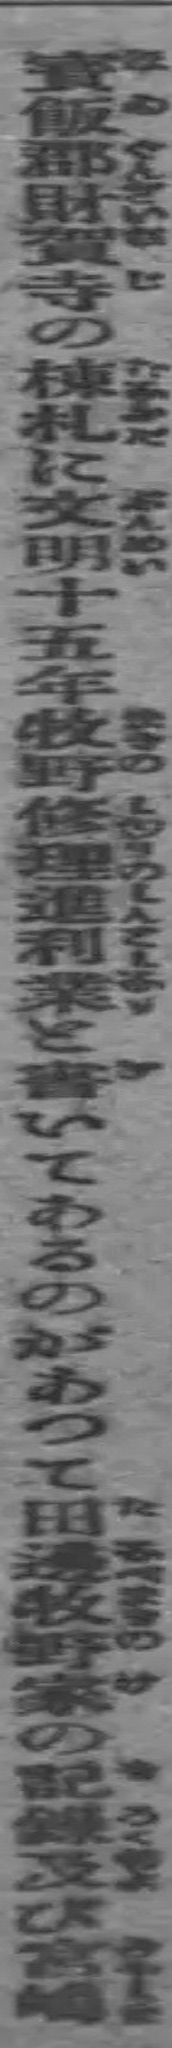宝飯郡財賀寺の棟札に文明十五年牧野修理進利業と書いてあるのがあつて田辺牧野家の記録及び宮嶋
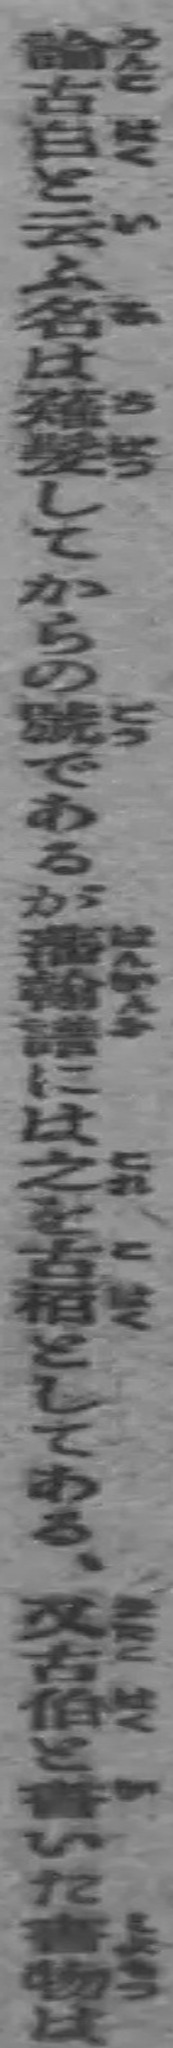論古白と云ふ名薙髪してからの号であるが藩翰譜には之を古柏としてある、又古伯と書いた書物は
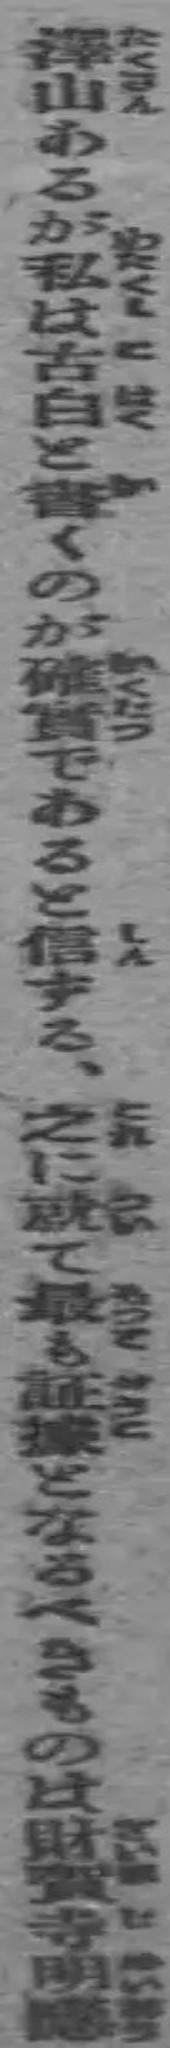古伯と古白沢山あるが私は古白と書くのが確実であると信ずる、之に就て最も証拠となるべきものは財賀寺明応
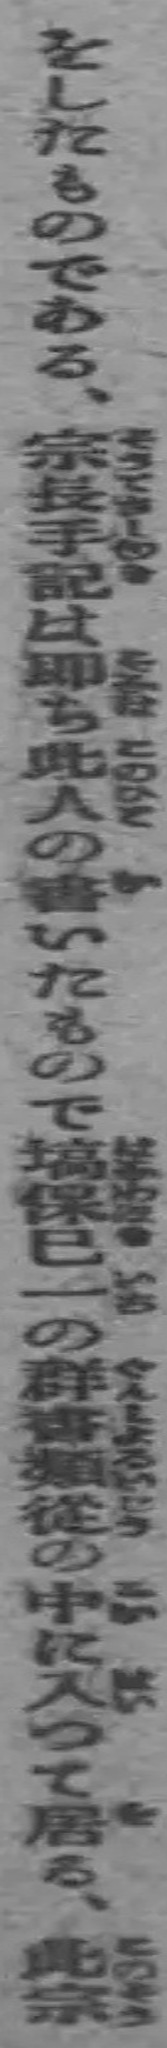をしたものである、宗長手記は即ち此人の書いたもので塙保巳一の群書類従の中に入つて居る、此宗
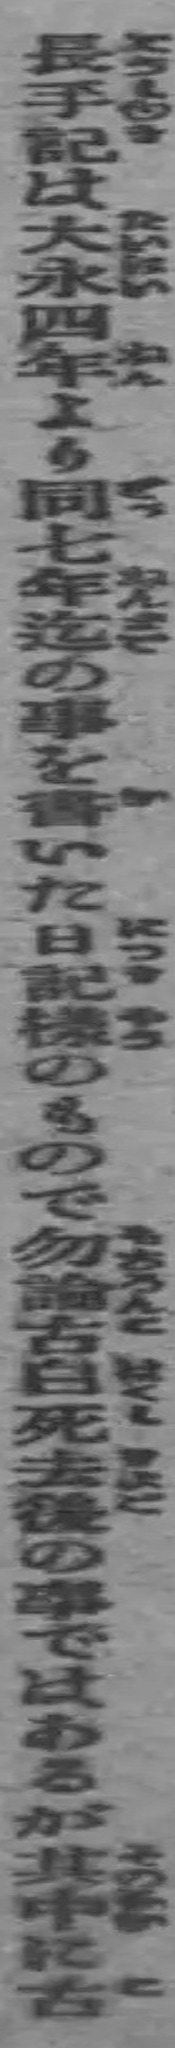長手記は大永四年より同七年迄の事を書いた日記様のもので勿論古白死去後の事ではあるが其中に古
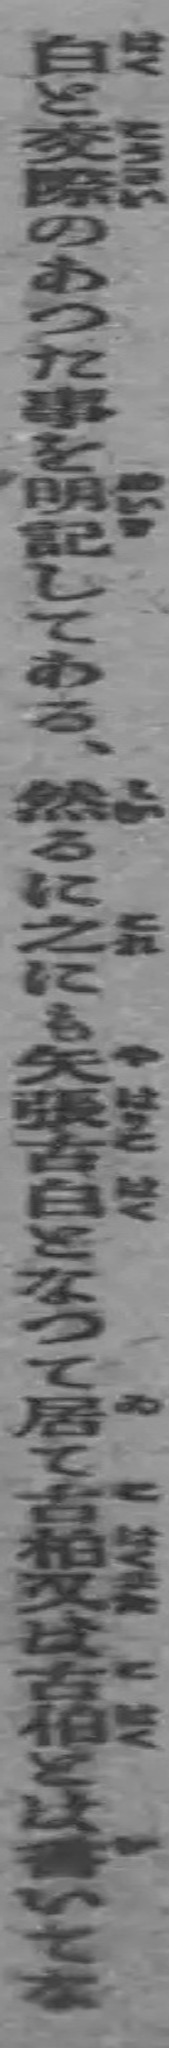白と交際のあつた事を明記してある、然るに之にも矢張古白となつて居て古柏又は古伯とは書いてな
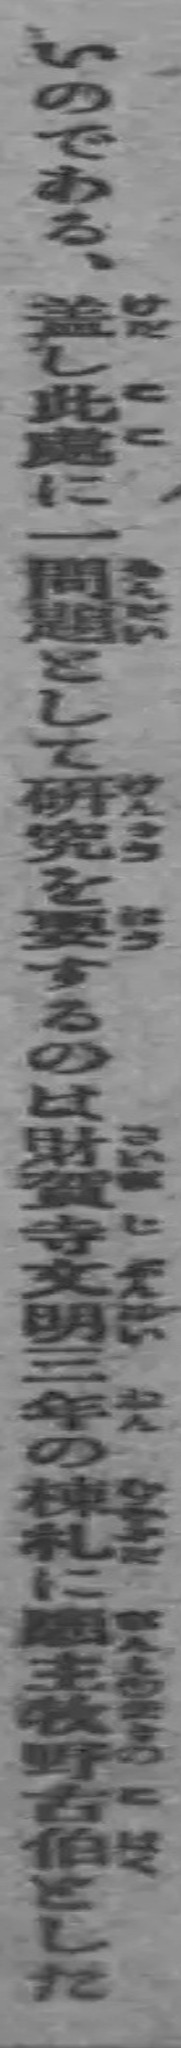いのである、蓋し此処に一問題として研究を要するのは財賀寺文明三年の棟札に願主牧野古伯とした
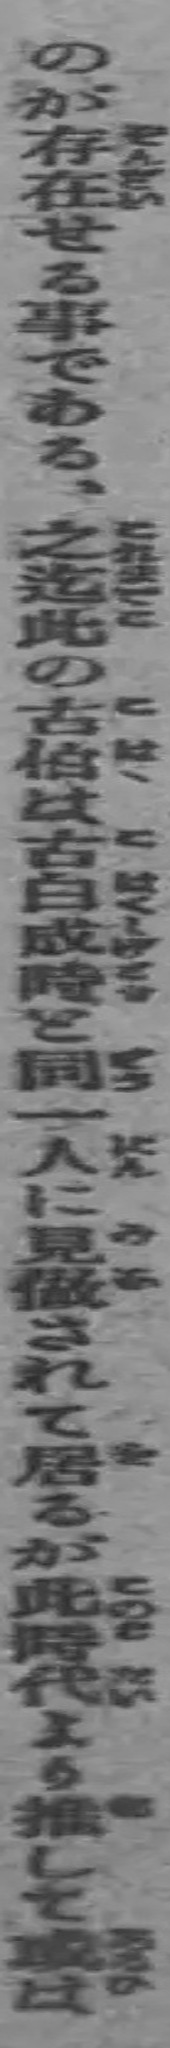のが存在せる事である、之迄此の古伯は古白成時と同一人に見做されて居るが此時代より推して或は
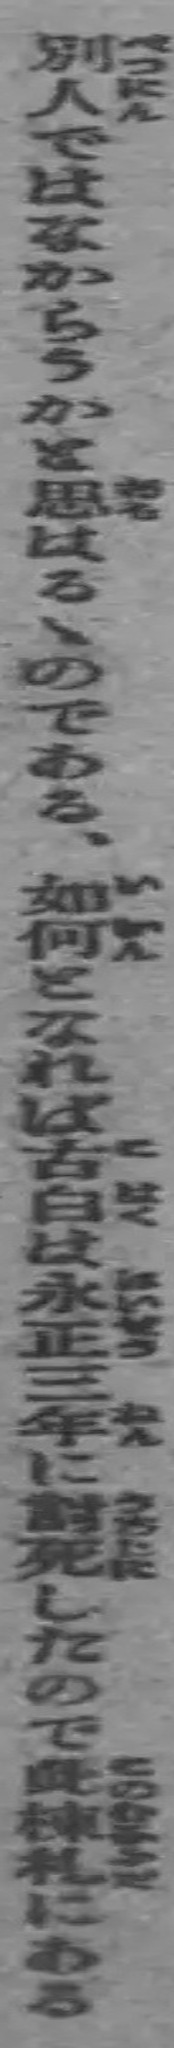別人ではなからうかと思はるゝのである、如何となれば古白は永正三年に討死したので此棟札にある
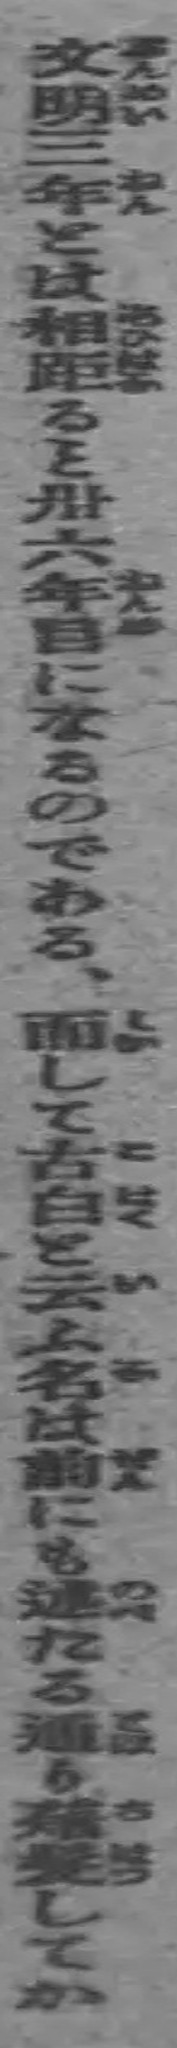文明三年とは相距ること卅六年目になるのである、而して古白と云ふ名は前にも述たる通り薙髪してか
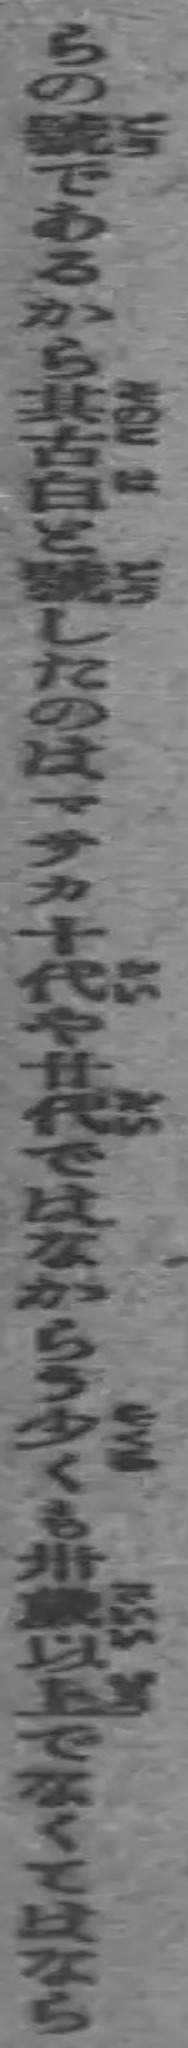らの号であるから其古白と号したのはマサカ十代や廿代ではなからう少くも卅歳以上でなくてはなら

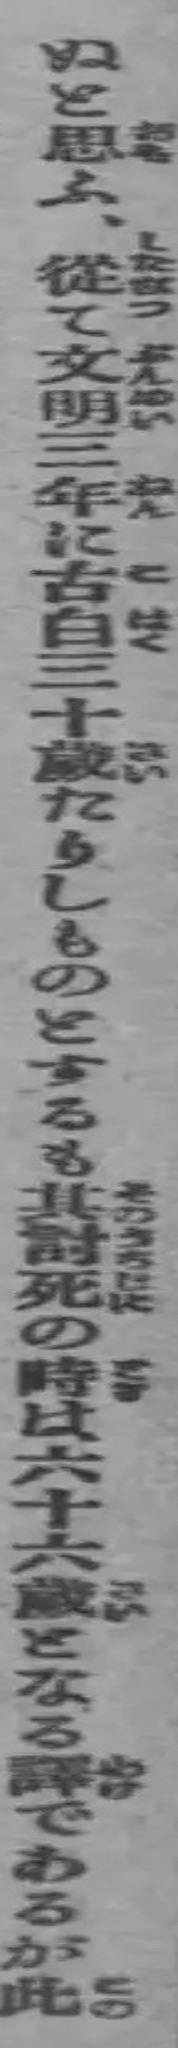ぬと思ふ、従て文明三年に古白三十歳たりしものとするも其討死の時は六十六歳となる訳であるが此
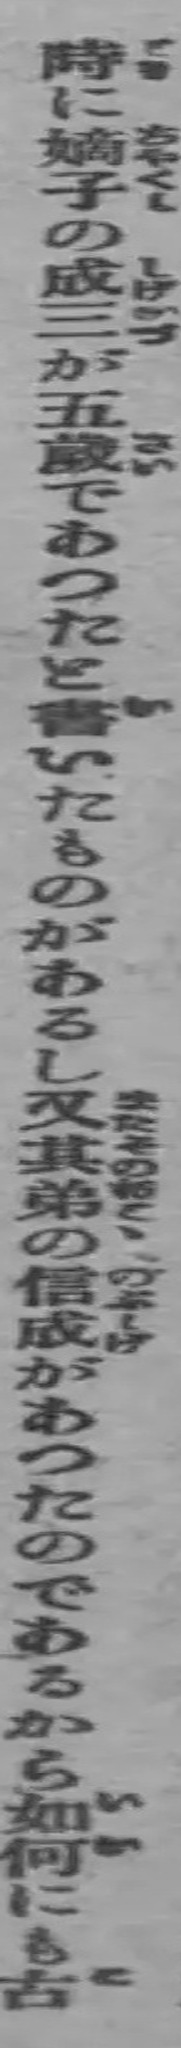時に嫡子の成三が五歳であつたと書いたものがあるし又其弟の信成があつたのあるから如何にも古
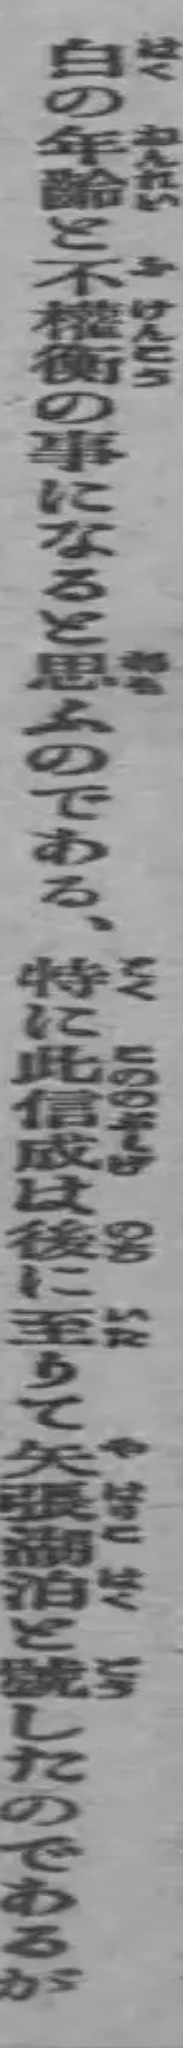白の年齢と不権衡の事になると思ふのである、特に此信成は後に至りて矢張湖泊と号したのであるが
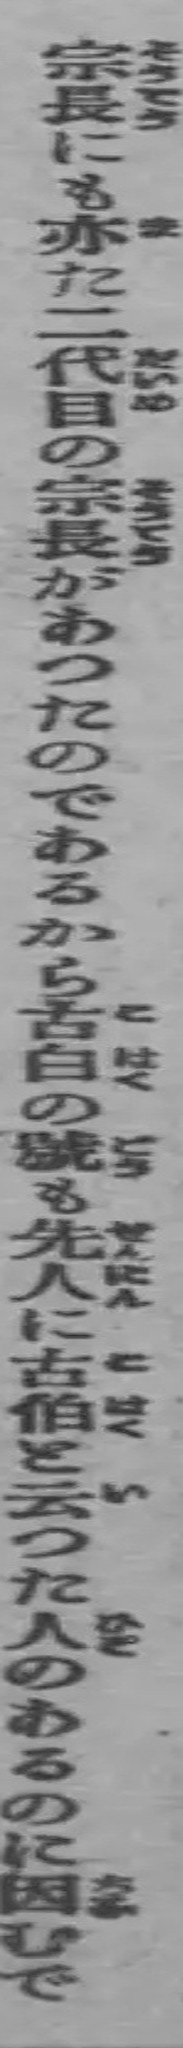宗長にも亦た二代目の宗長があつたのであるから古白の号も先人に古伯と云つた人のあるのに因むで
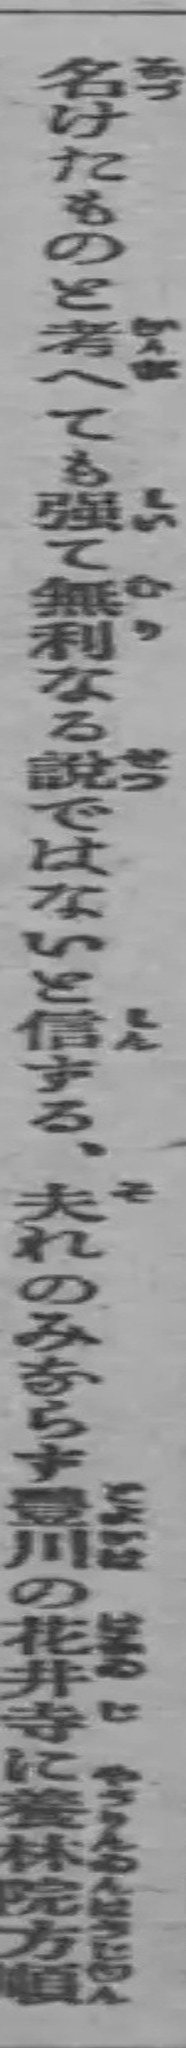名けたものと考へても強て無利なる説ではないと信ずる、夫れのみならず豊川の花井寺に養林院方順
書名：豊橋市史談
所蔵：国立国会図書館 National Diet Library, JAPAN
